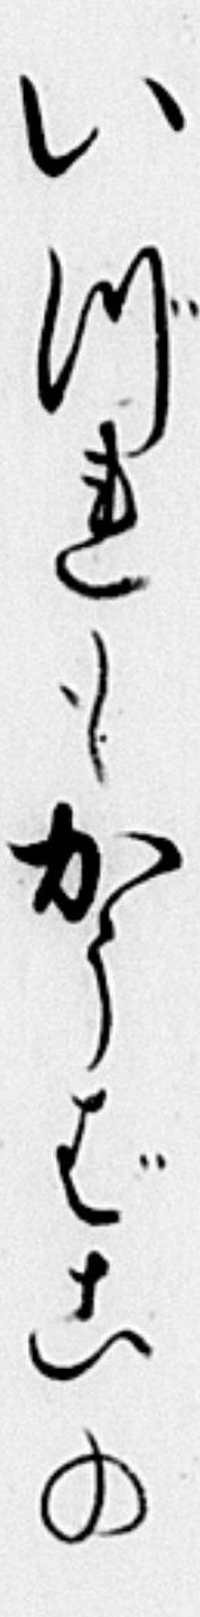いつれもかうばこの
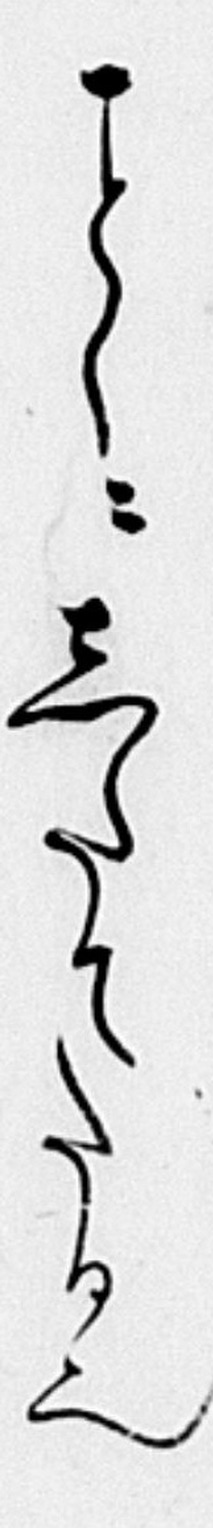ことくにしたてたる
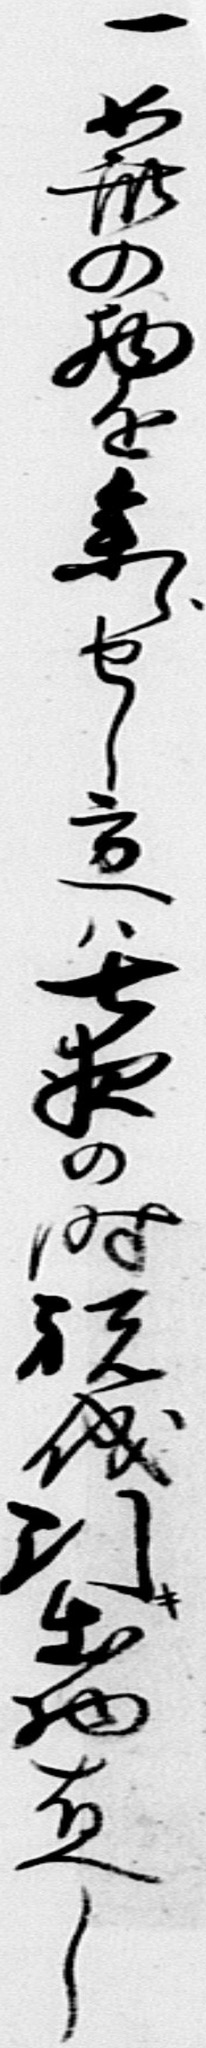一女此物を参らせし方へは七夜の時祝儀引き出物有へし
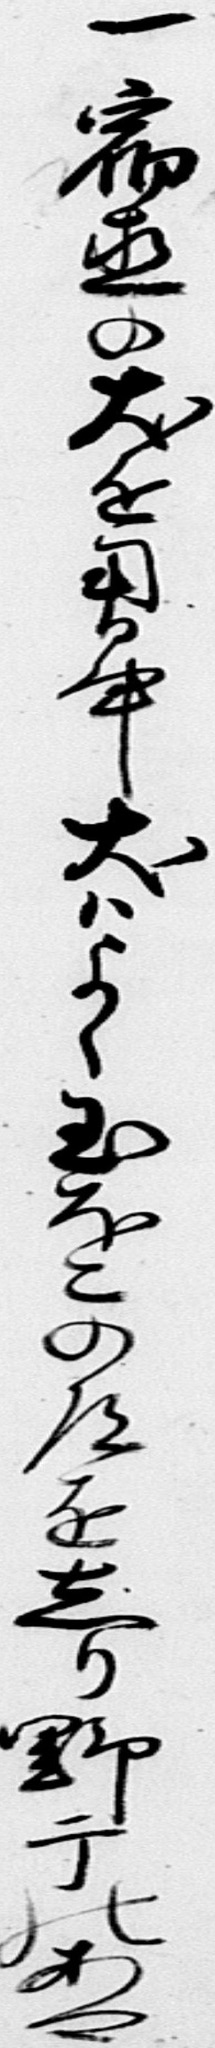一宿直の犬を用る事犬はよく玉ほこの道をしり野干のあや
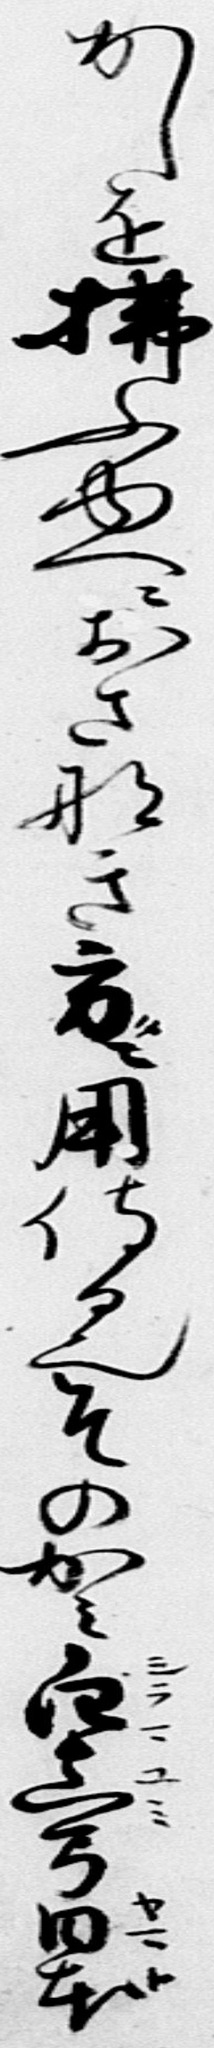かしを払ふゆへにおさなき方たに用侍る也其かみ白真弓日本
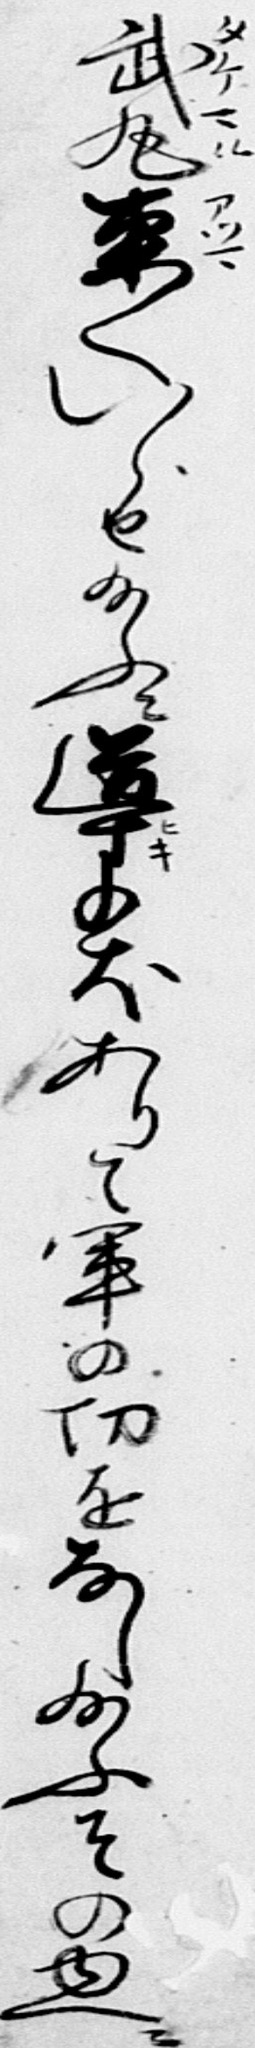武丸東へいらせ給ふに導ひきの犬ありて軍の功をなし給ふそのゆへに

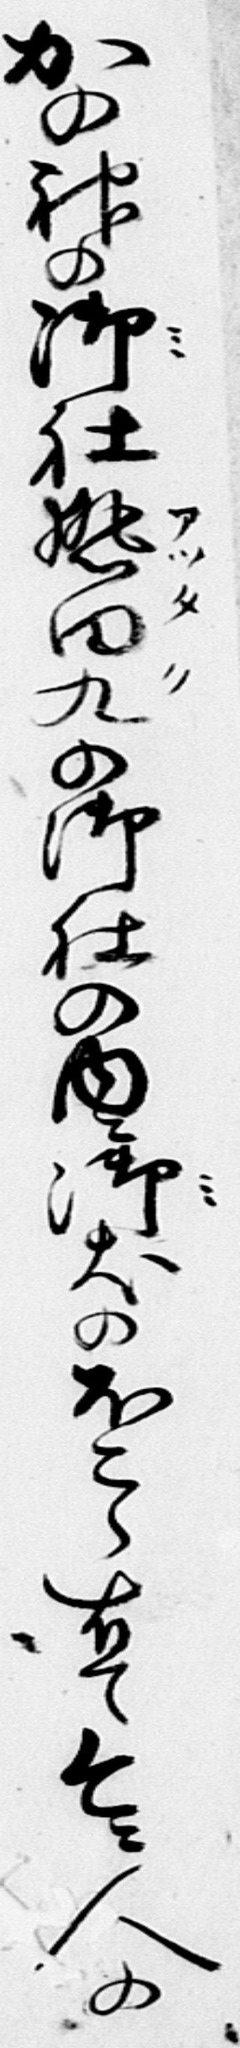かの神の御社熱田九の御社の内に御犬のほこら有て今に人の
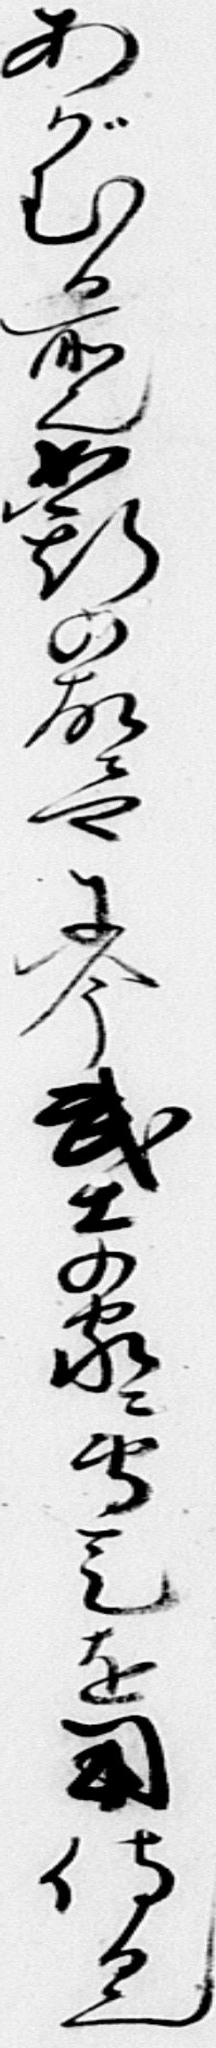あがむる所也如斯の故にやに今武士の家に専是を用侍る也
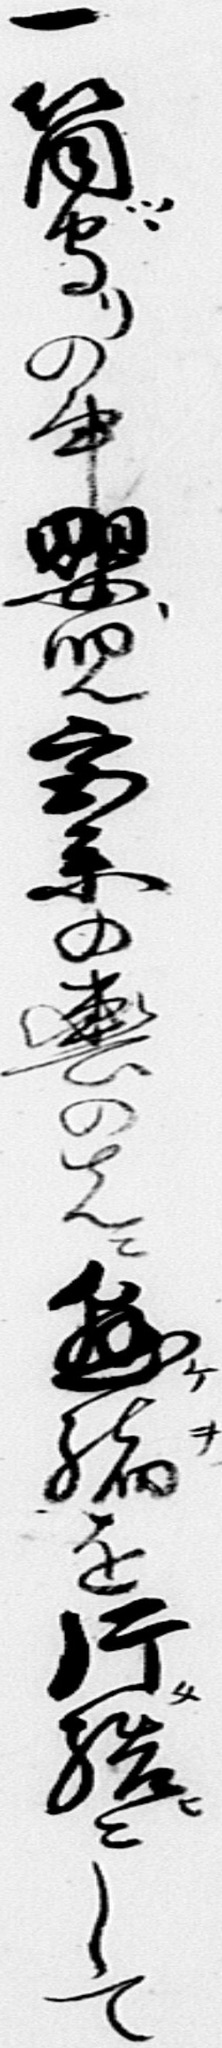一筒守りの事嬰児宮参の輿の先に懸け緒を片た結ひにして
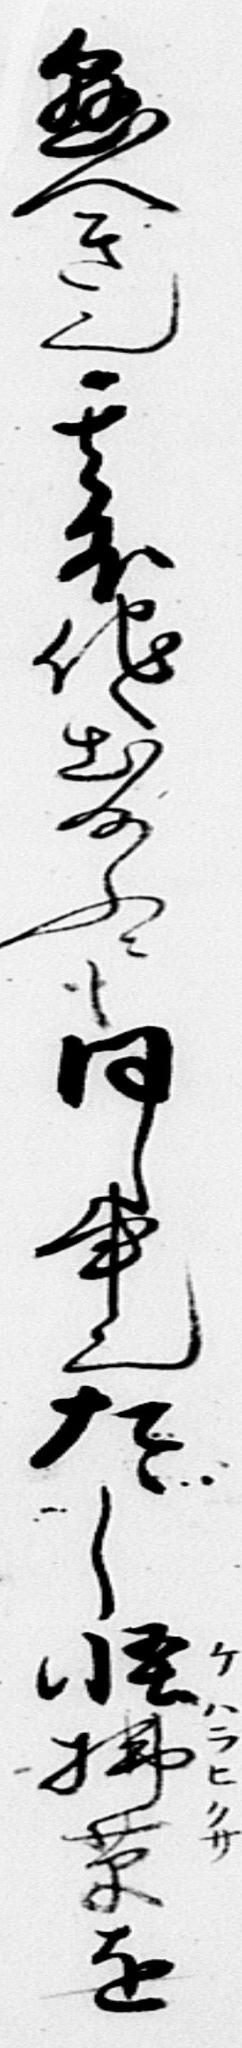懸へき也其外他へ出給ふにも同し事也たゞし怪払草を
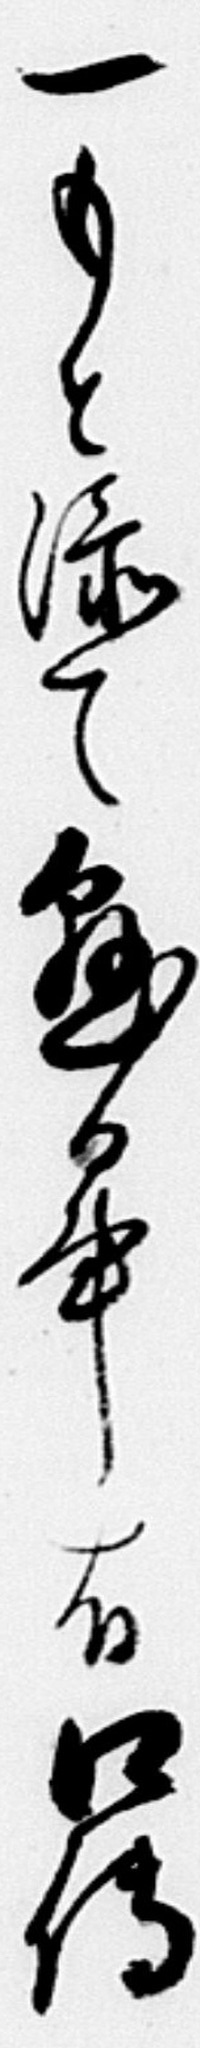一もと添て懸る事有口伝
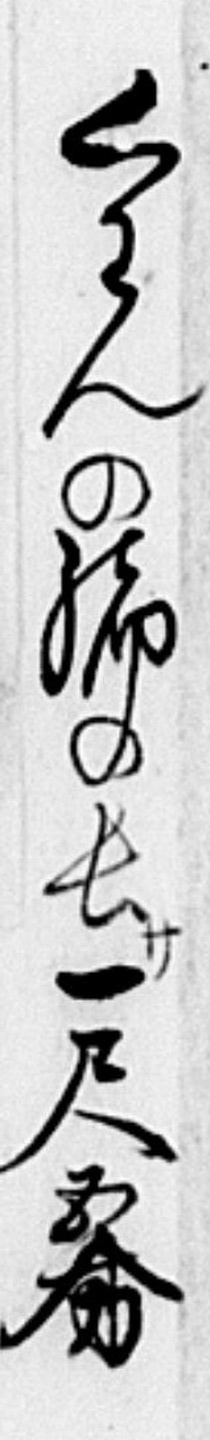くわんの緒の長さ一尺五分
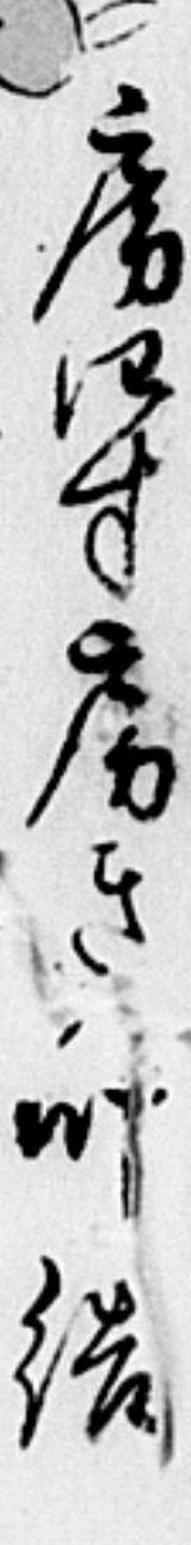房四寸房き叶結
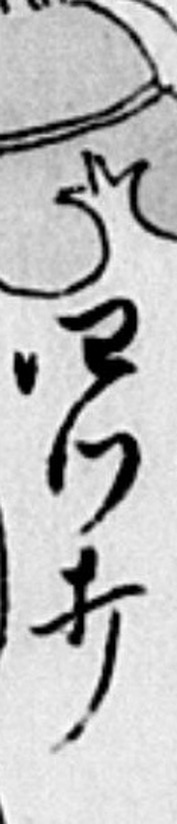四つ打
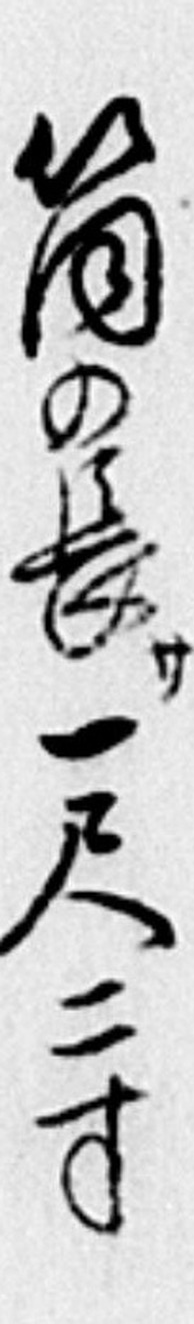筒の長さ一尺二寸
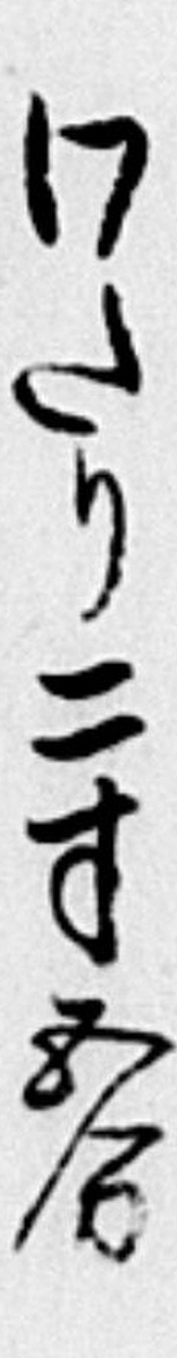わたり二寸五分
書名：天児之書（あまがつのしょ）
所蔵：徳島県立図書館
